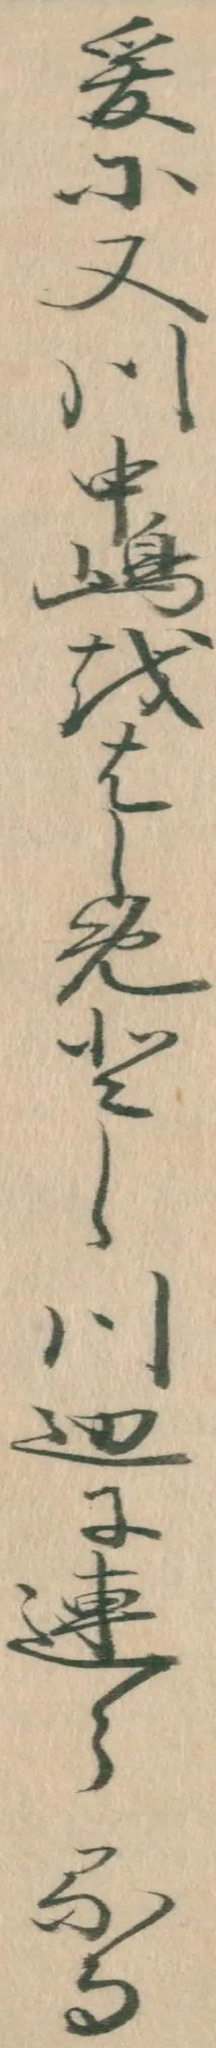爰に又川中嶋をはしめとし川辺に連らるる
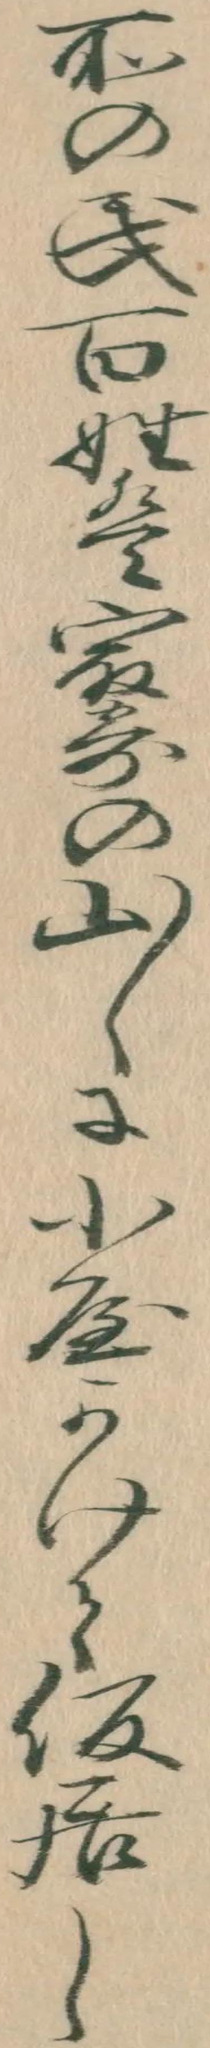所の民百姓は最寄の山〳〵に小屋かけて仮居し
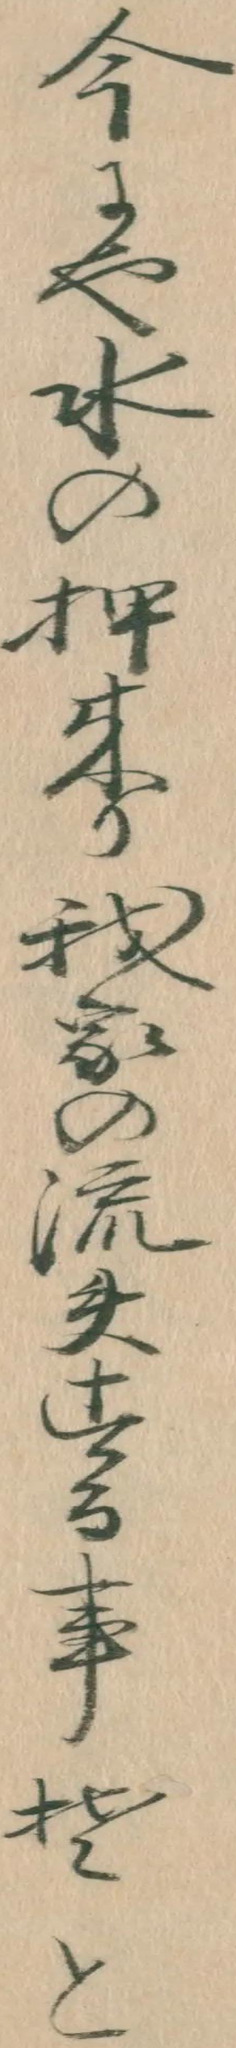今にや水の押来り我家の流失する事そと
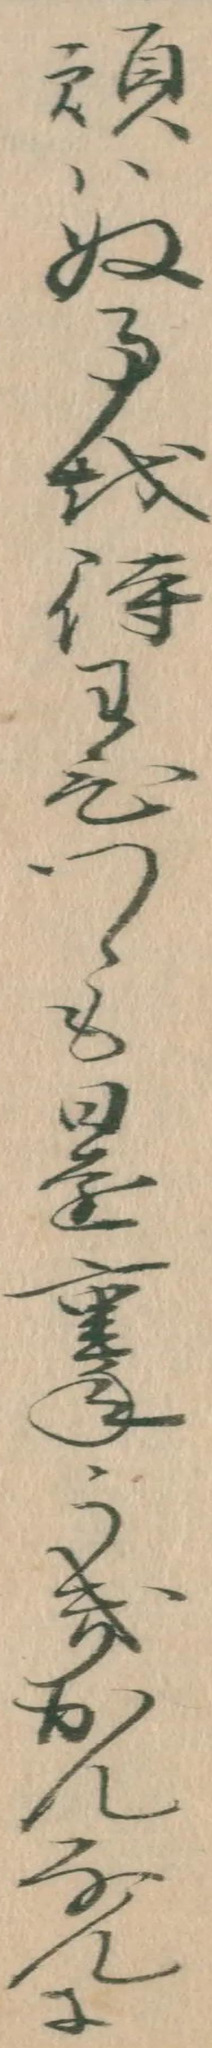願はぬ事を待わひつゝも日を重ねうきかんなんに
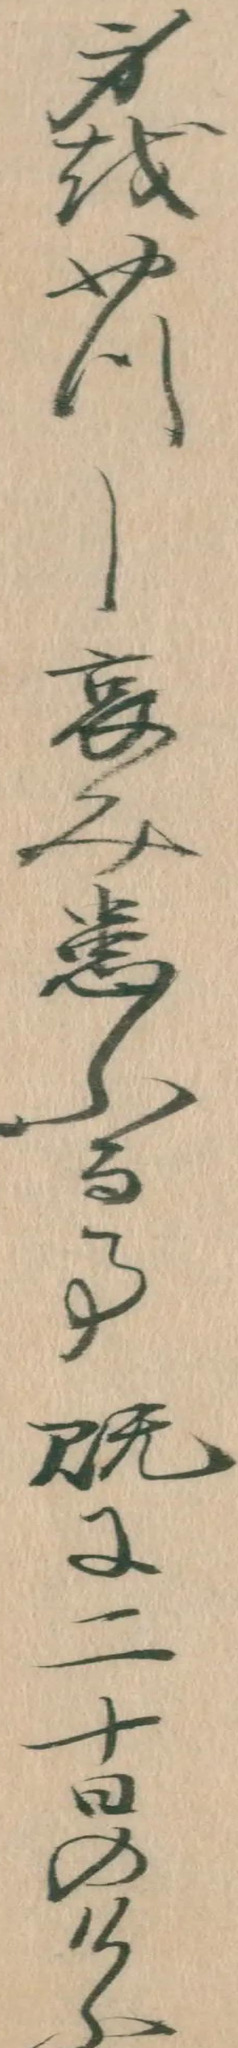身をやつし哀み患ふる事既に二十日のけふ
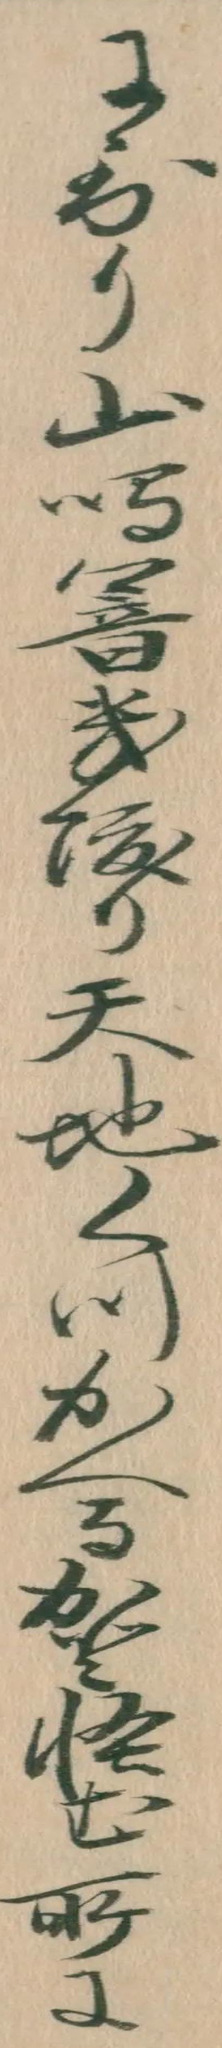に至り山鳴響き渡り天地くつかへるかと恪む所に
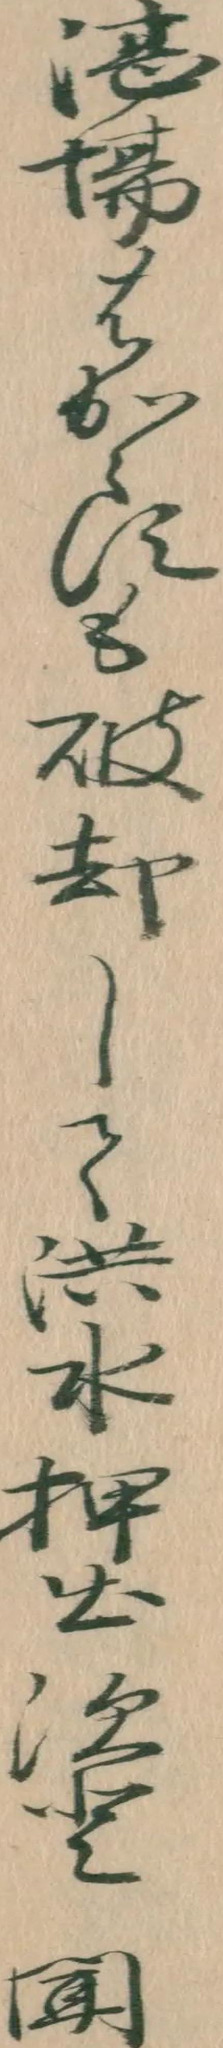湛場はからすも破却して洪水押出すと聞
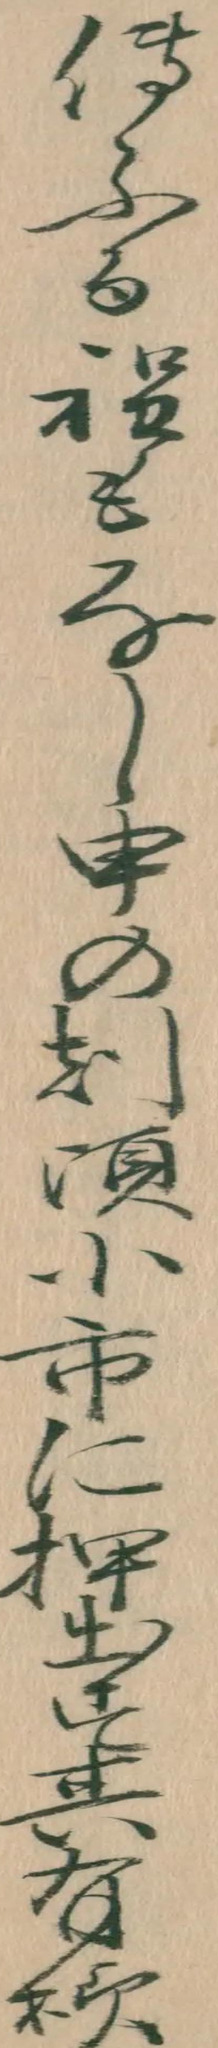伝ふる程もなし申の刻頃小市に押出す其有様
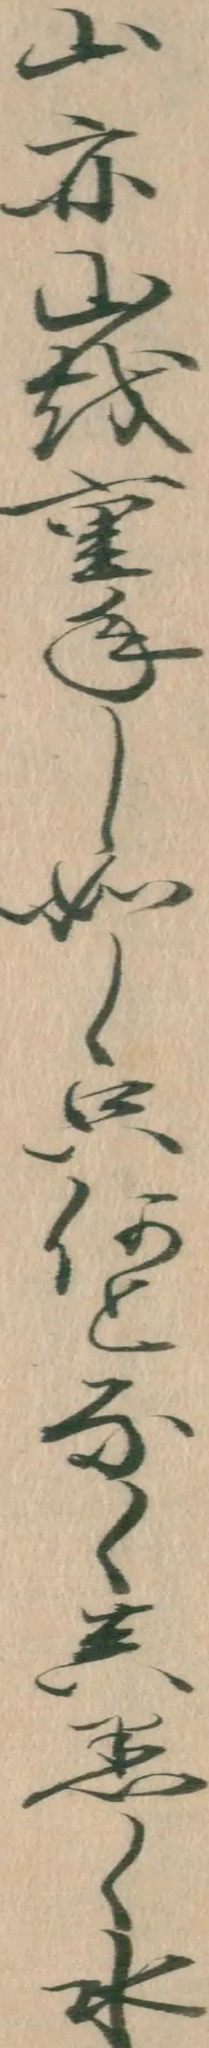山亦山を重ねし如し只何となく真黒し水
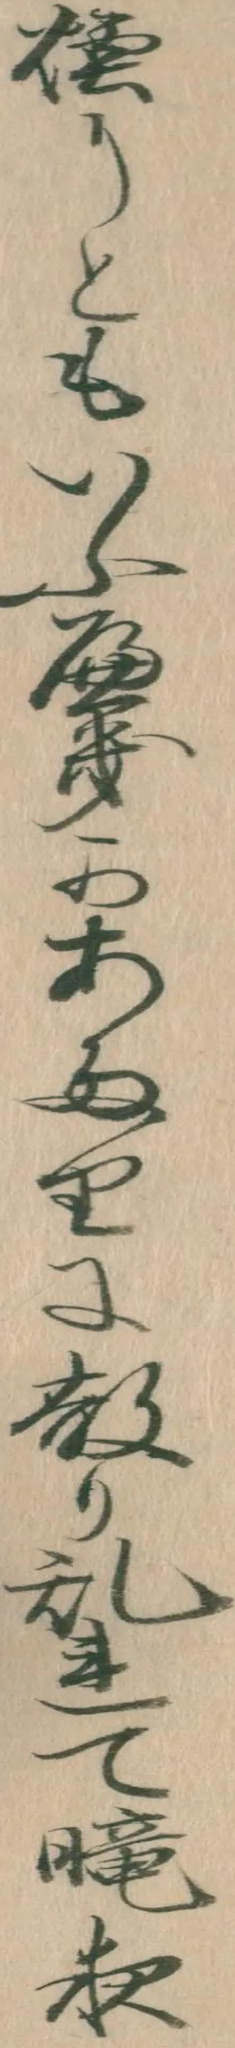煙りともいふへきかあたりに散り乱れて晻夜
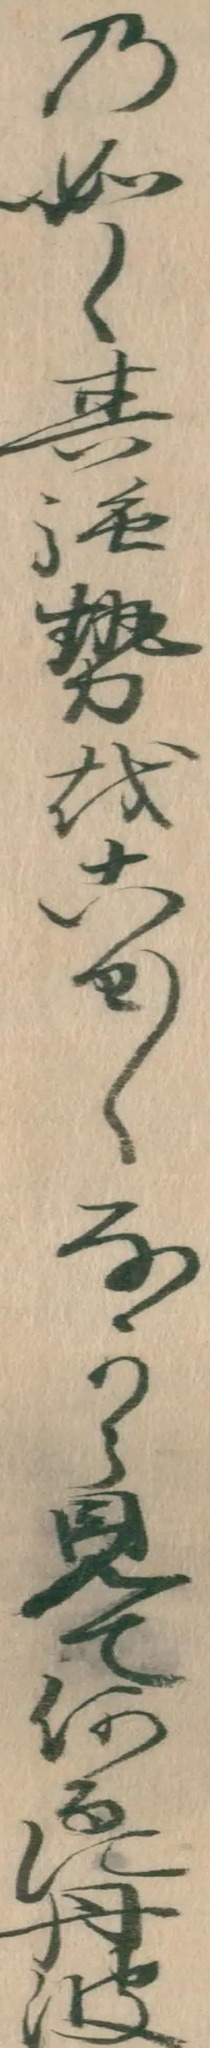の如し其強勢をこわ〳〵なから見てあるに丹波
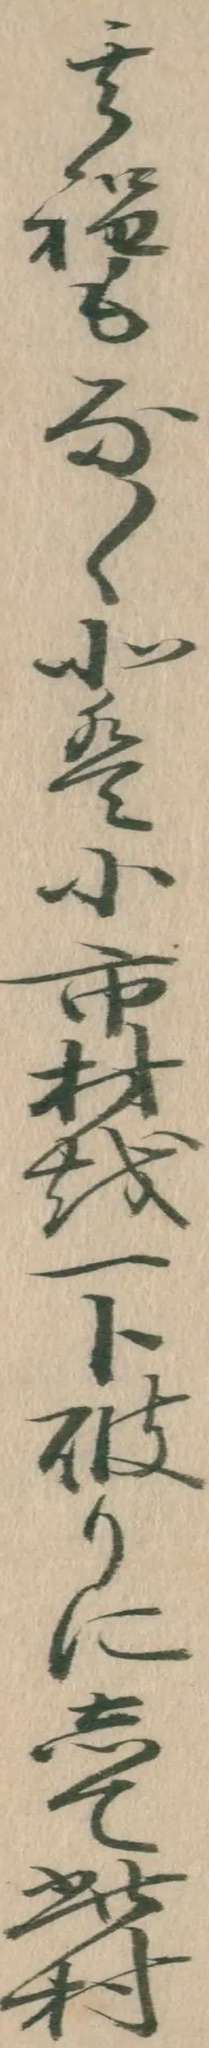其程もなく北は小市村を一ト被りにして此村
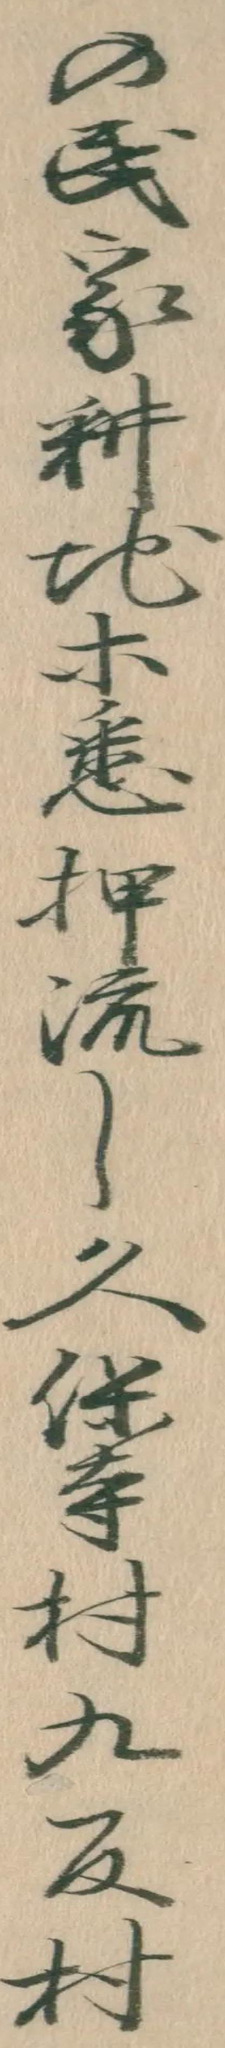の民家耕地等悉押流し久保寺村九反村
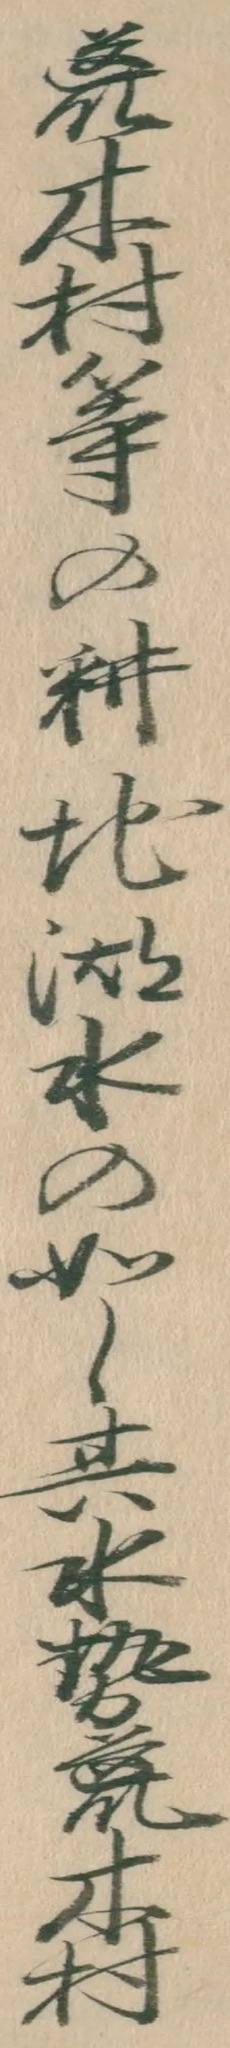荒木村等の耕地湖水の如し其水勢荒木村
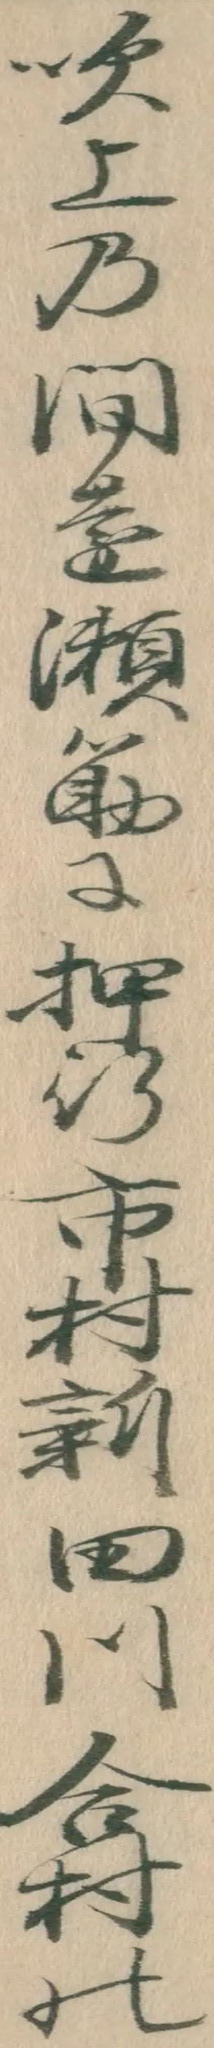吹上の間を瀬筋に押行市村新田川合村の
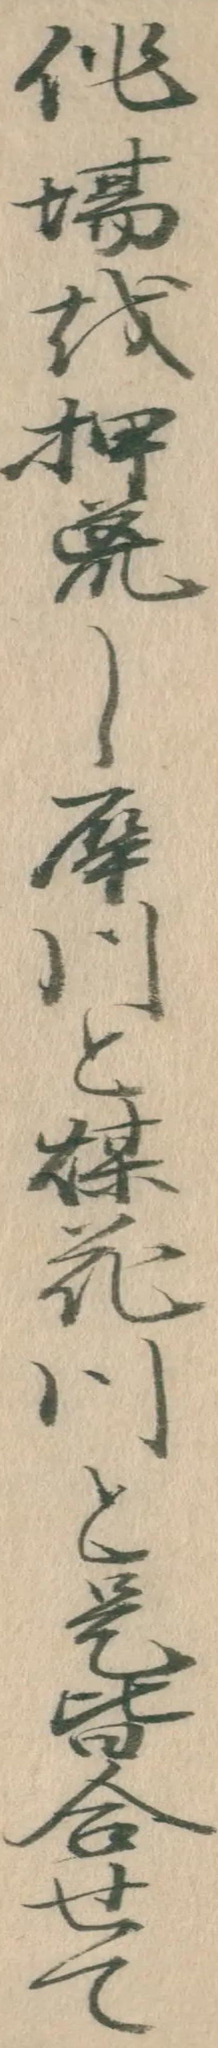作場を押荒し犀川と煤花川と是皆合せて
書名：俗語之種. [7]
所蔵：国立国会図書館 National Diet Library, JAPAN
